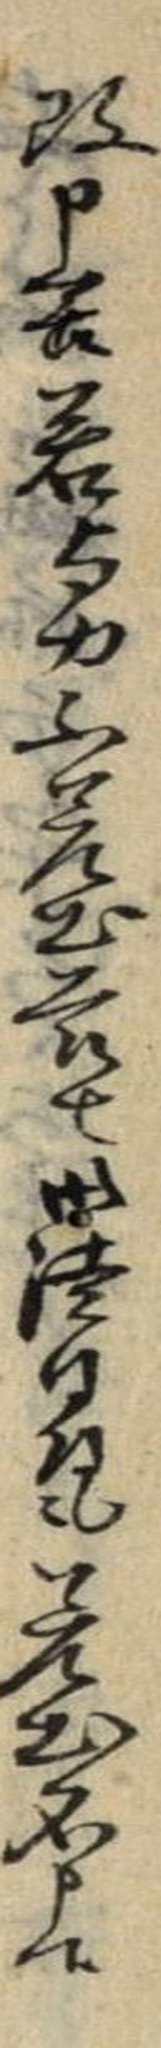改申筈若与力不差出節は御徒目付も差出不申候
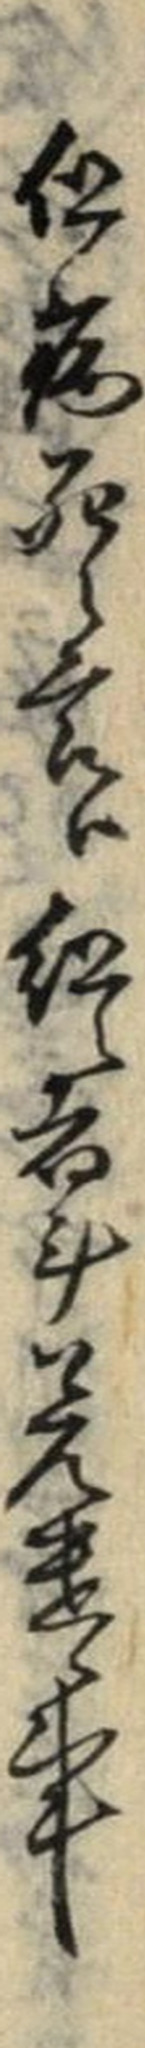但病死之節は組之者斗差遣候事
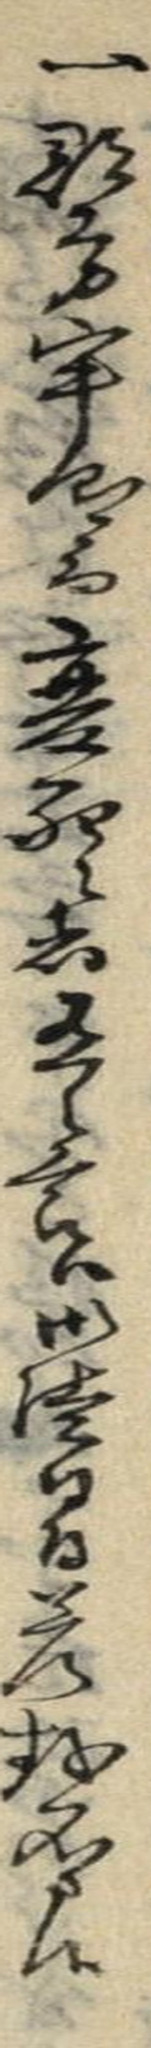一郡方牢屋にて変死之者有之節は御徒目付差越不申候
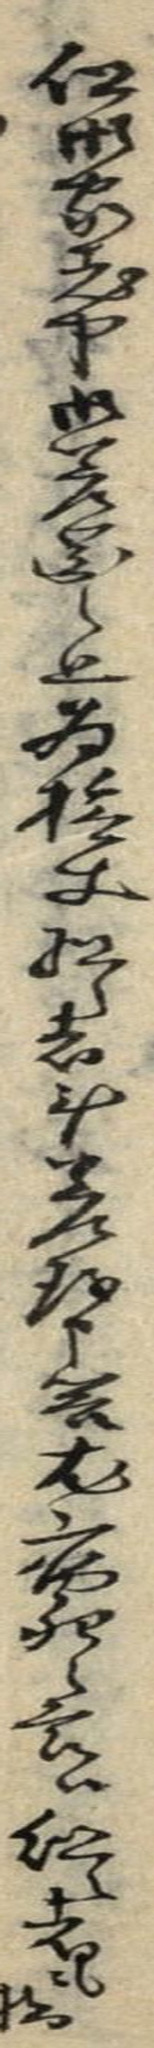但御家老中御差図之上為検使組之者斗差越申筈尤病死之節は組之者も指
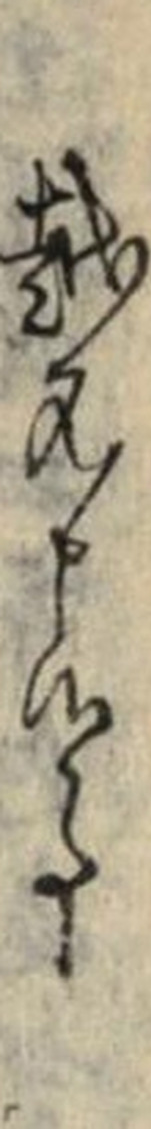越不申候事
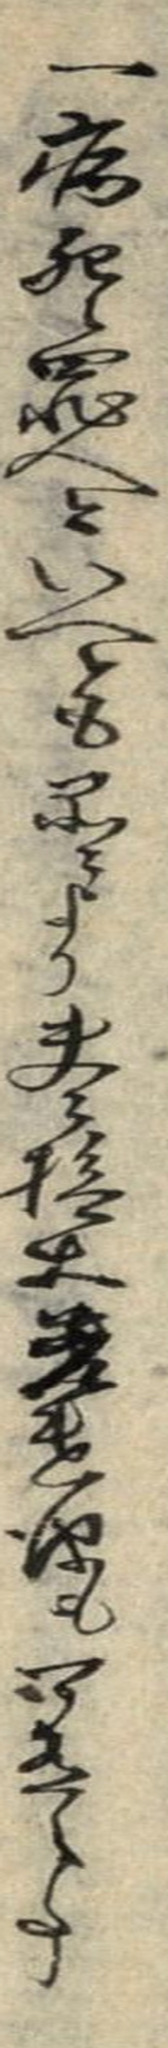一病死之罪人といへとも品により夫々検使差遣儀も可有之事
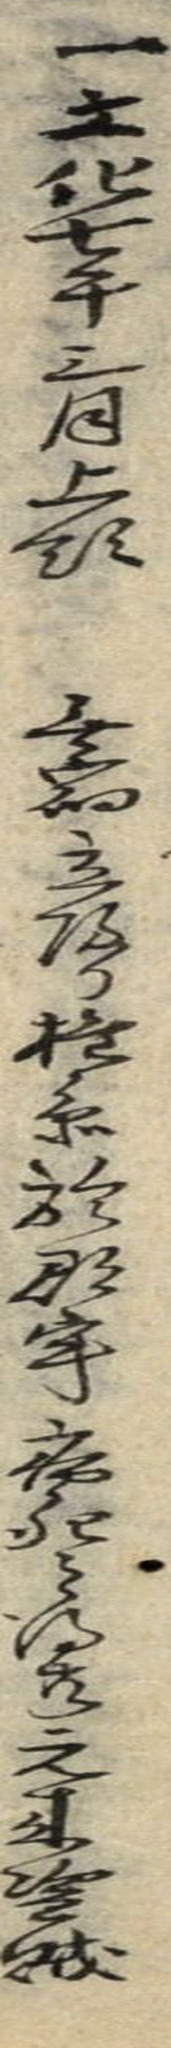一文化七午三月上領無宿立帰り権兵衛於郡牢病死に候得共元来盗賊
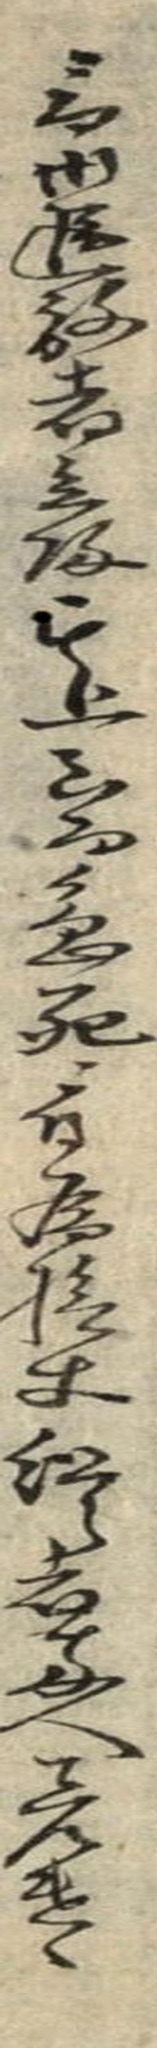にて御追放者立帰其上至て急死に付為検使組之者両人差遣候
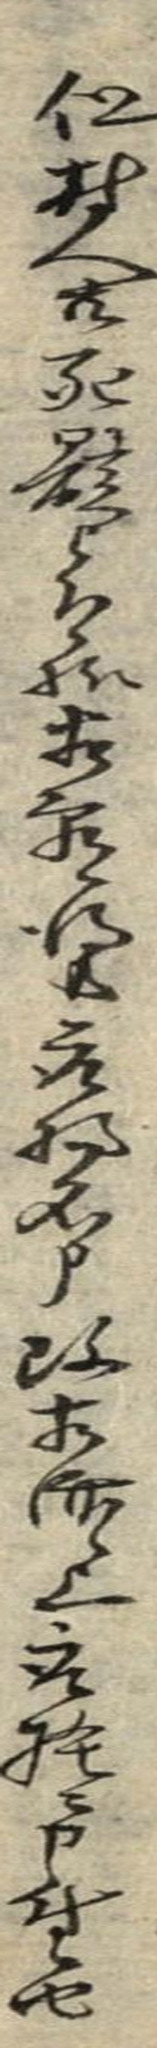但村人共死骸被下候様相願候得共取揚不申改相済候上取捨に申付候由
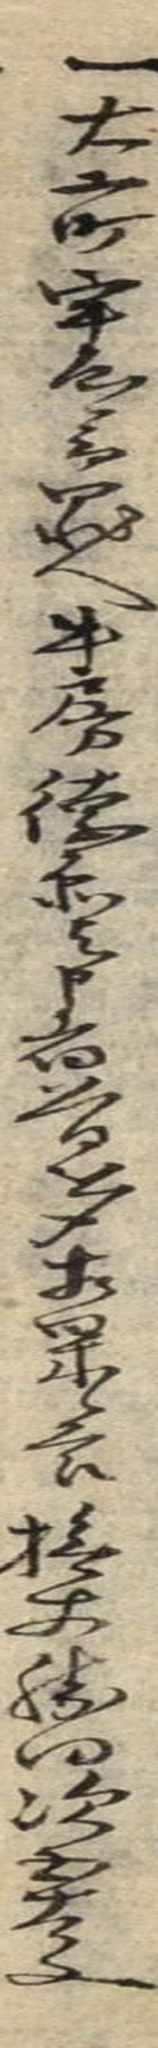一大工町牢屋にて罪人午房徳兵衛と申者首を〆相果候節検使勝田次五大夫
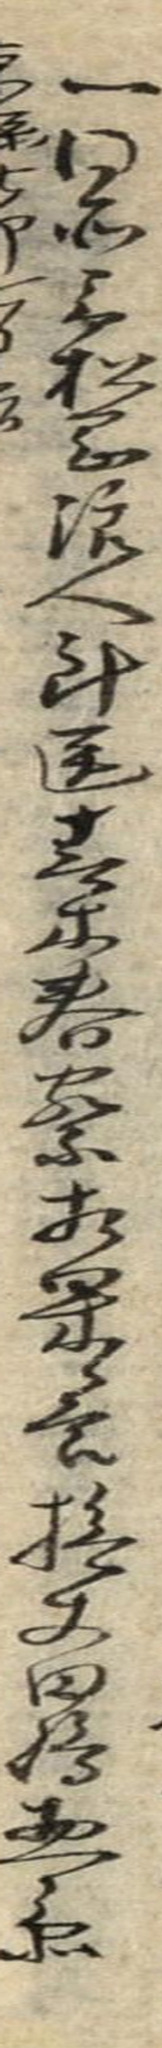一同所にて松岡浪人針医春木春察相果候節検使田島惣兵衛
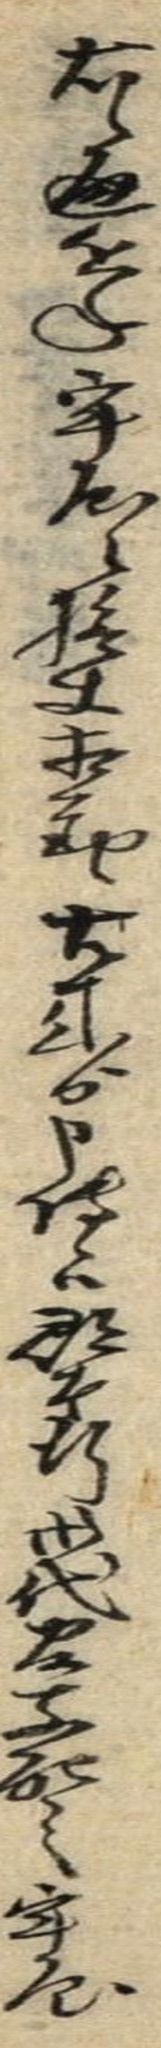右之通近年牢屋へ検使相勤候古来ゟ申伝候は郡奉行御代官支配之牢屋
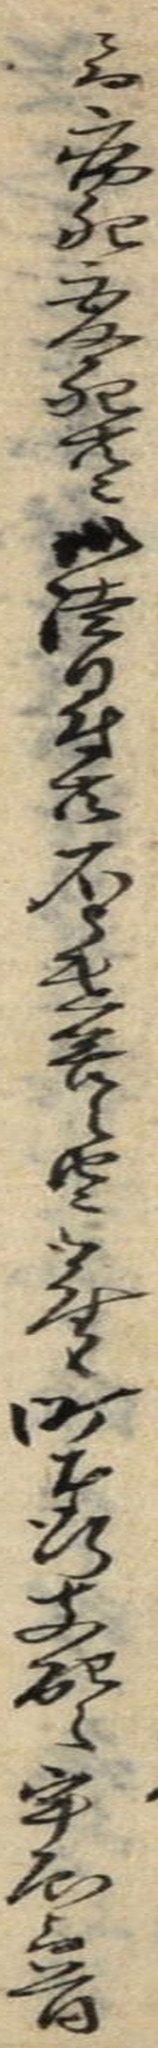にて病死変死共に御徒目付共不被遣筈之由に御座候町奉行支配之牢屋にて首

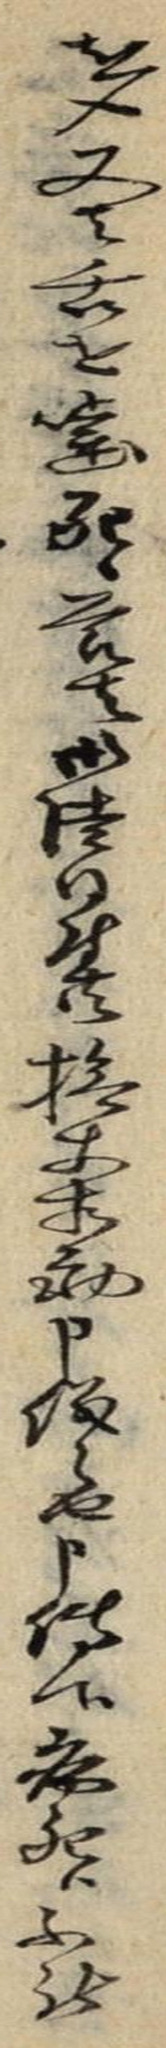を〆又は舌を噛死候節は御徒目付共検使相勤申儀之由申伝候病死は不被
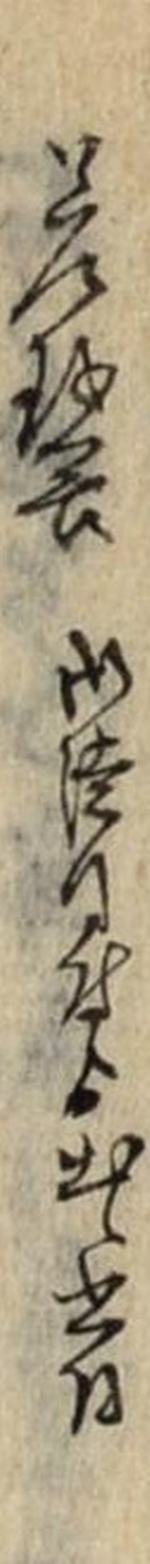差越筈御徒目付ゟ出候書付
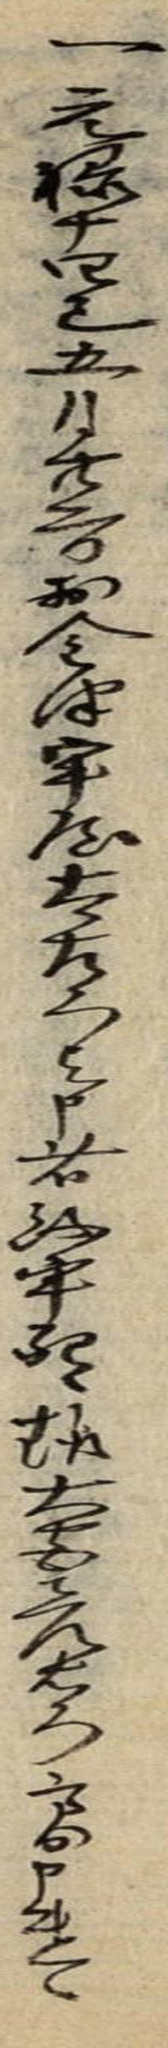一元禄十四巳五月廿二日於金津牢屋太左衛門と申者致牢死候趣大宮彦右衛門方ゟ申遣候
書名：御停止異変死失
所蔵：福井県文書館 Fukui Prefectural Archives
